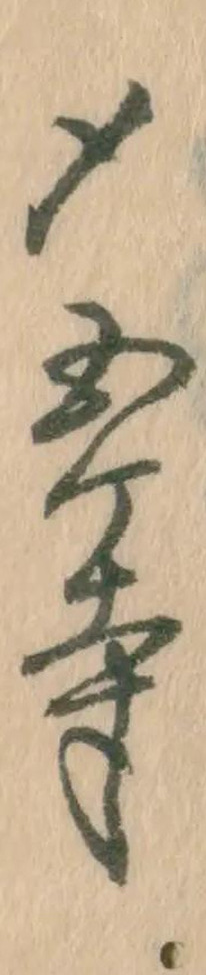〆五ケ寺

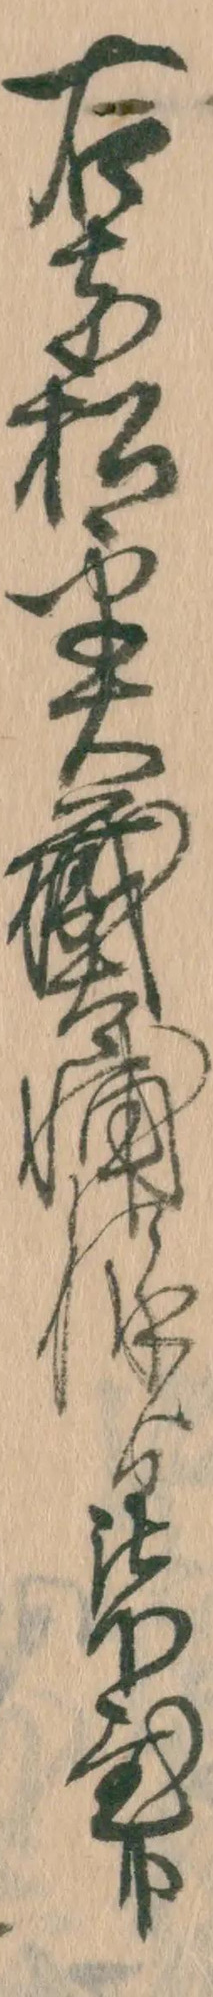右は松平大蔵太輔様ゟ被下置候
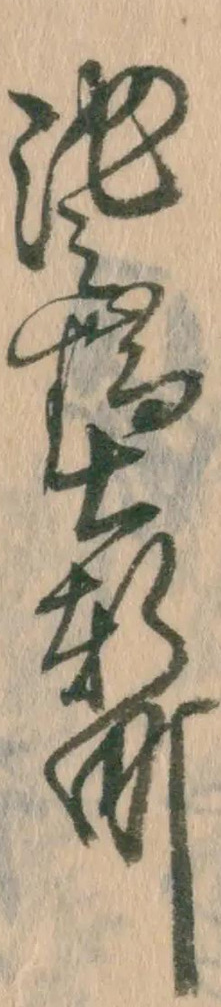池之端七軒町
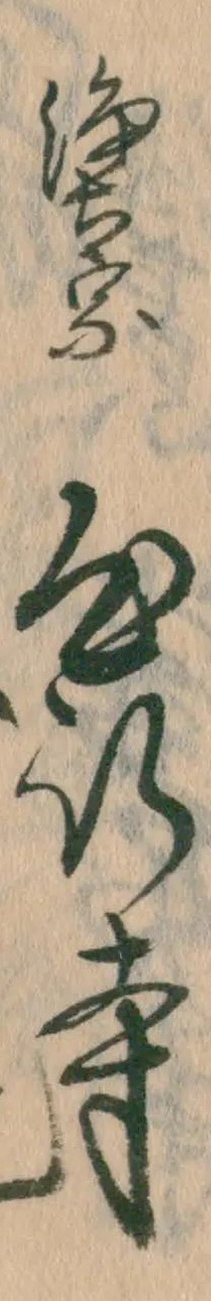浄土宗心行寺
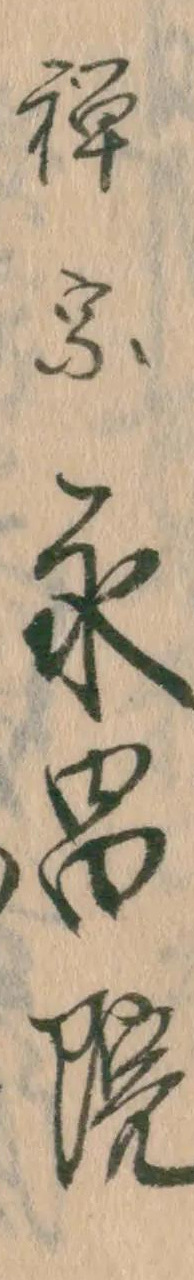禅宗永昌院
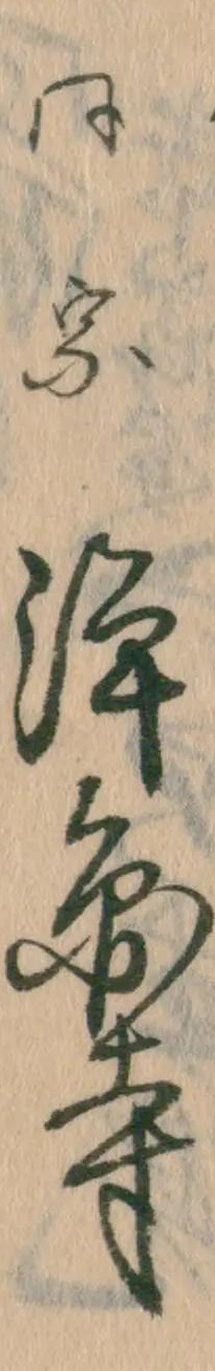同宗浄円寺
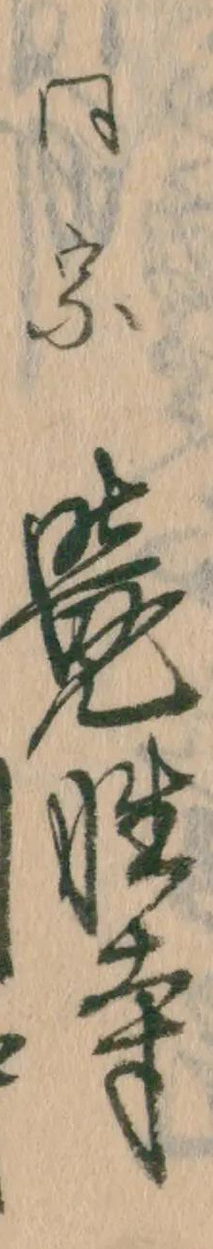同宗浄円寺
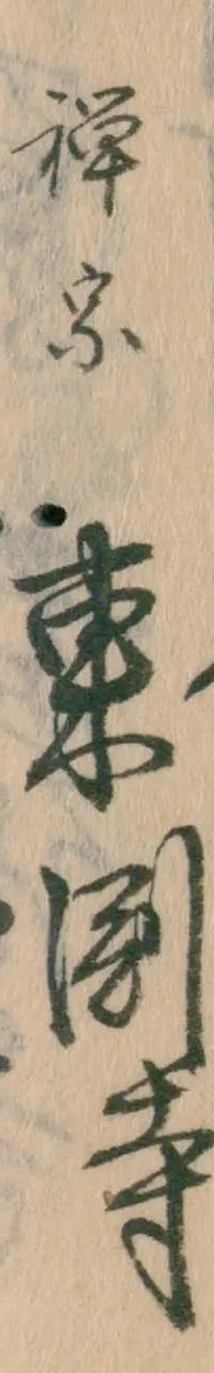禅宗正慶寺
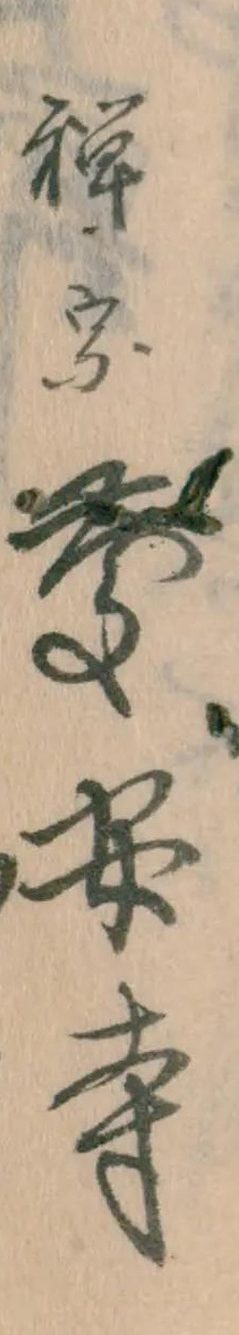禅宗慶安寺
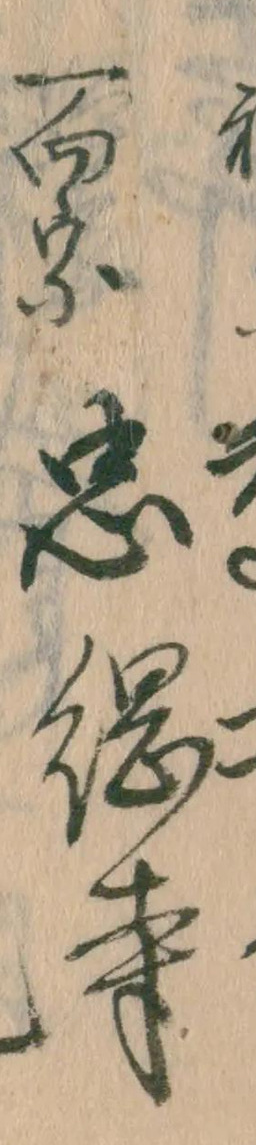一向宗忠綱寺
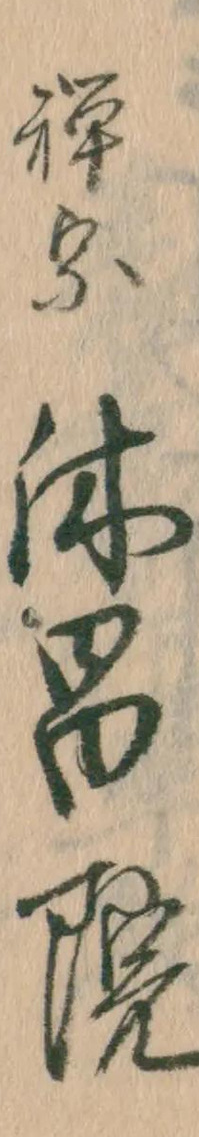禅宗休昌院

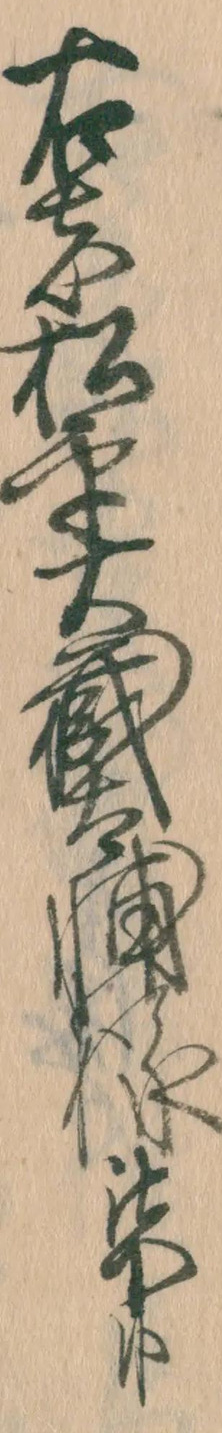右は松平大蔵太輔様ゟ被下置候
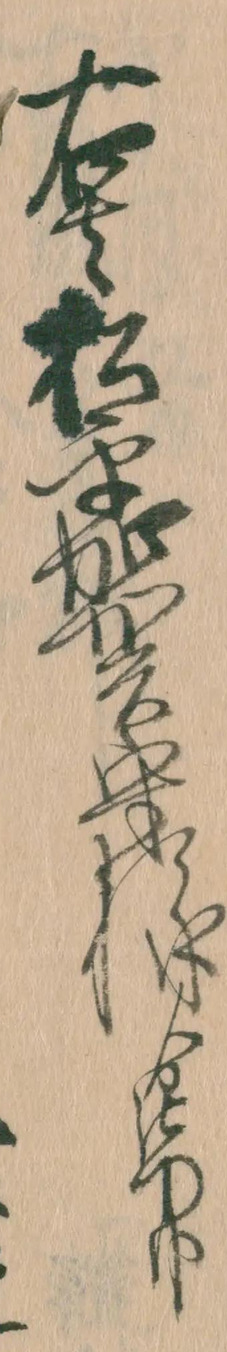右は松平加賀守様ゟ被下候
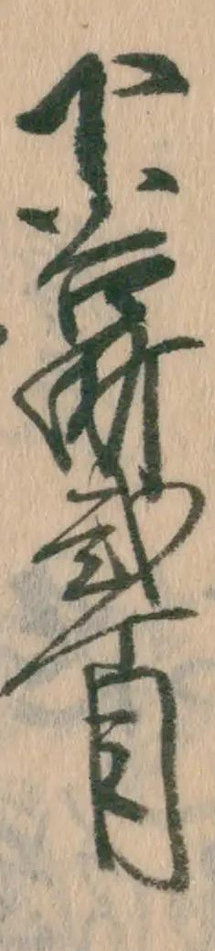下谷町弐丁目
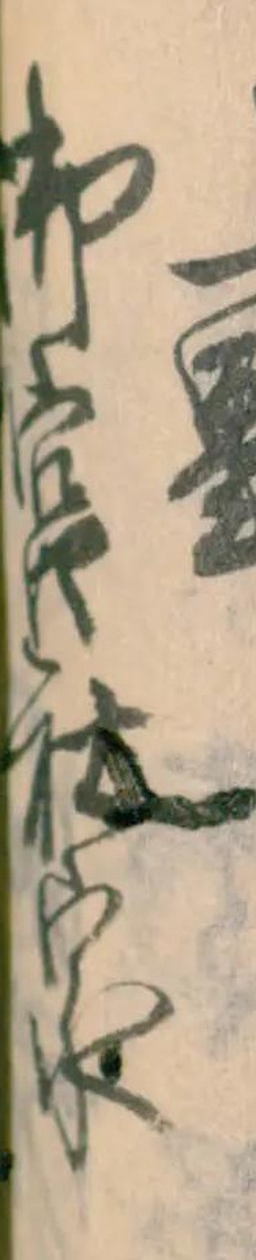御宮社家
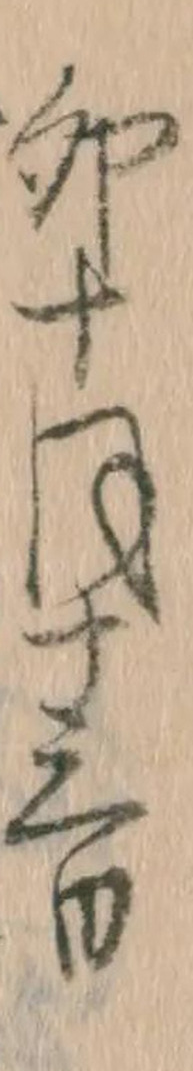卯十月十三日
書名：武家方并寺院等ニテ施差出候一件
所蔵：国立国会図書館 National Diet Library, JAPAN
